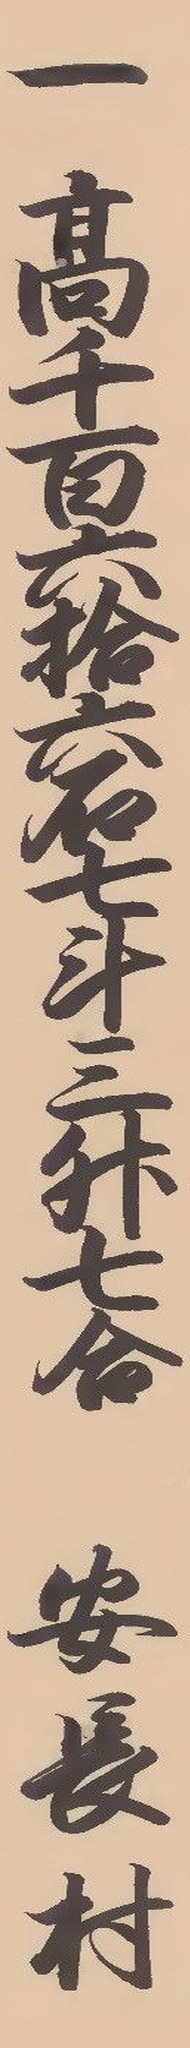一高千百六拾六石七斗三升七合安長村

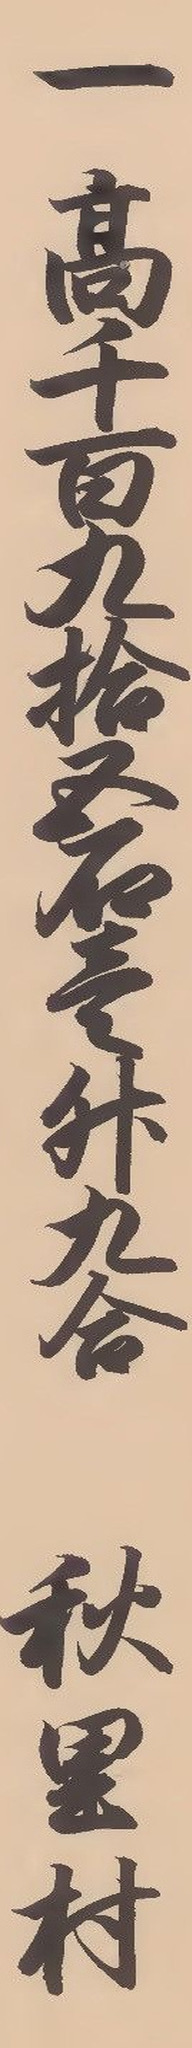一高千百九拾五石壱升九合秋里村
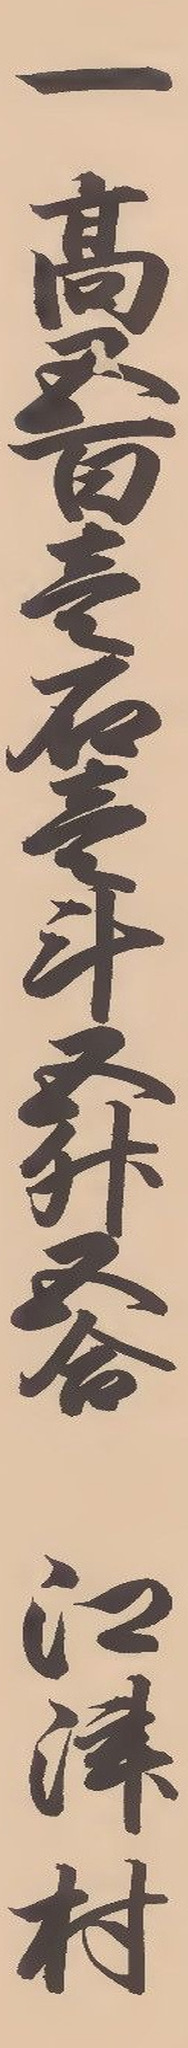一高五百壱石壱斗五升五合江津村
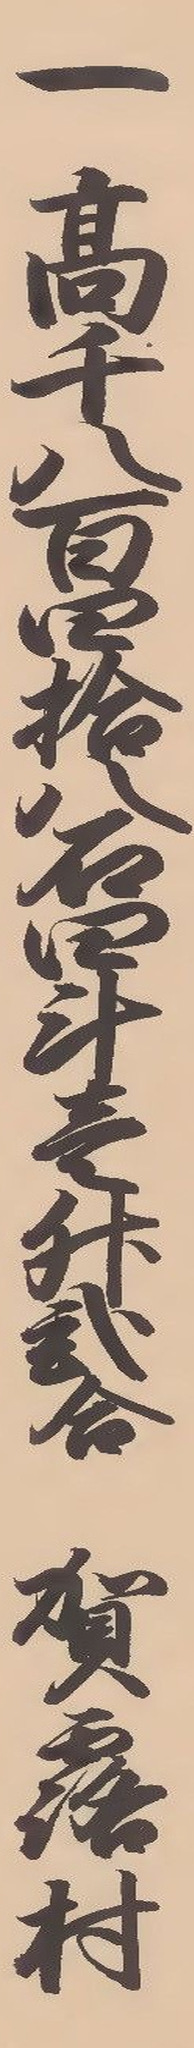一高千八百四拾八石四斗壱升弐合賀露村
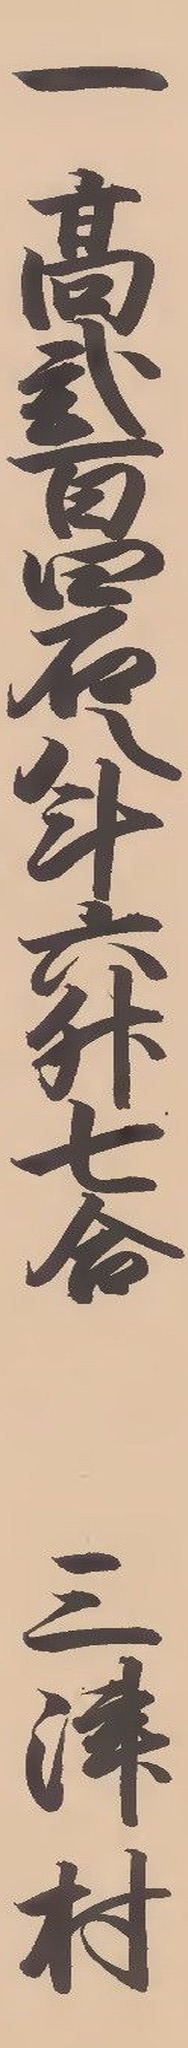一高弐百四石八斗六升七合三津村
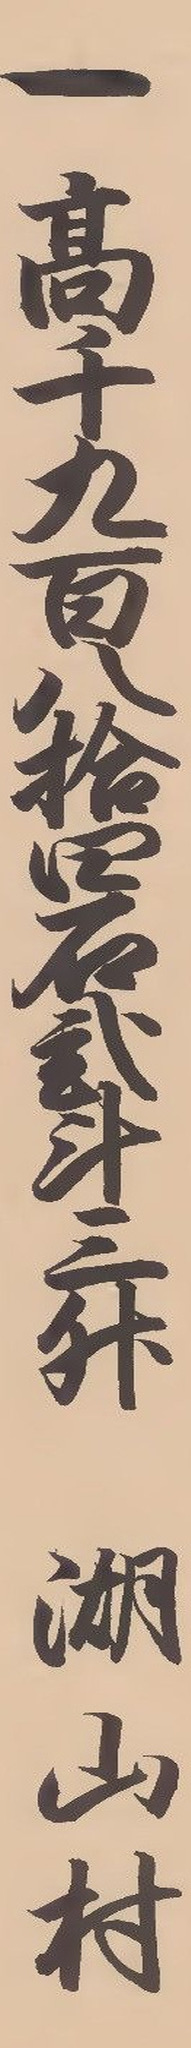一高千九百八拾四石弐斗三升湖山村

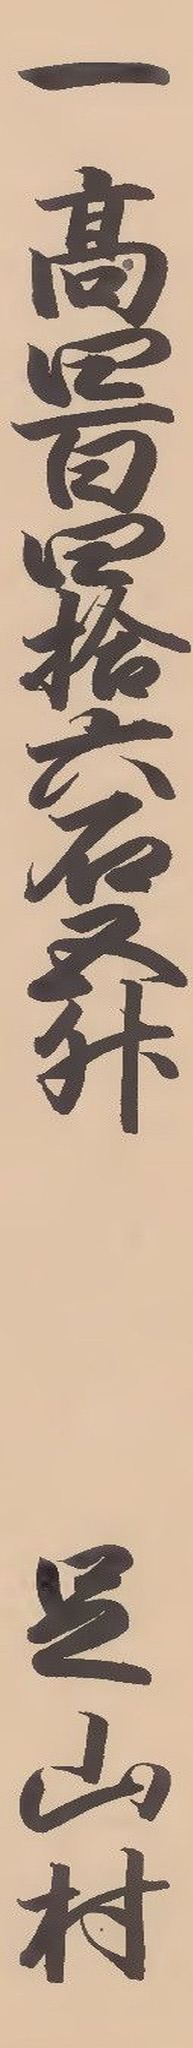一高四百四拾六石五升足山村
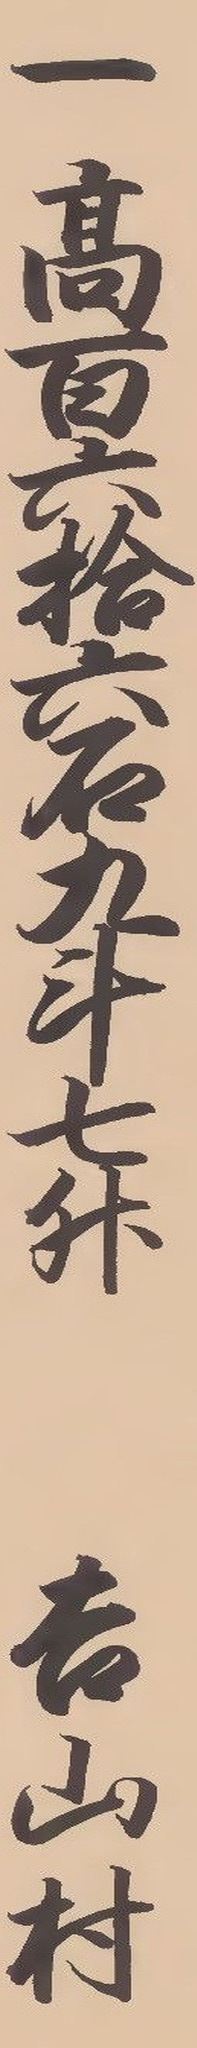一高百六拾六石九斗七升吉山村
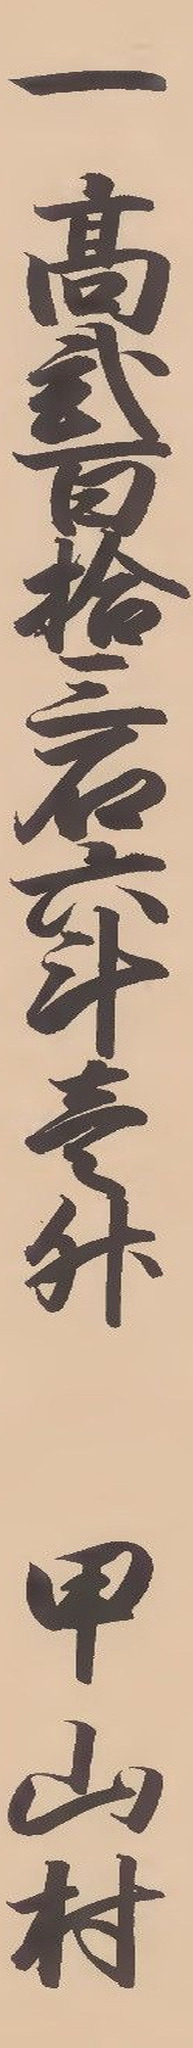一高弐百拾三石六斗壱升甲山村
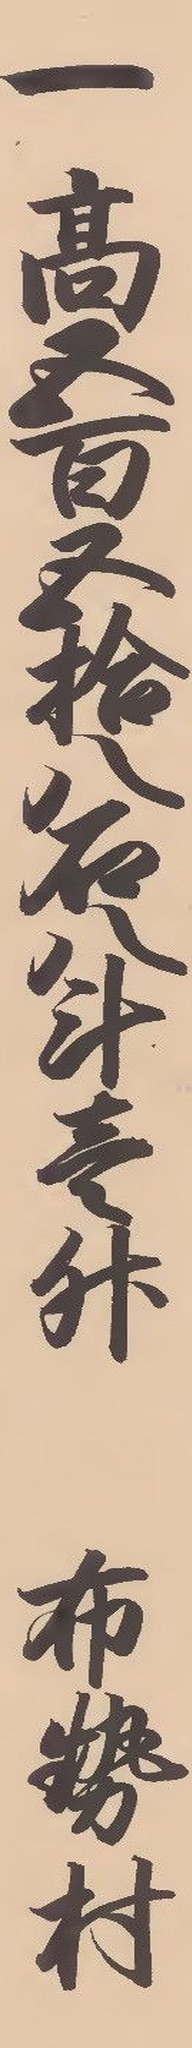一高五百五拾八石八斗壱升布勢村
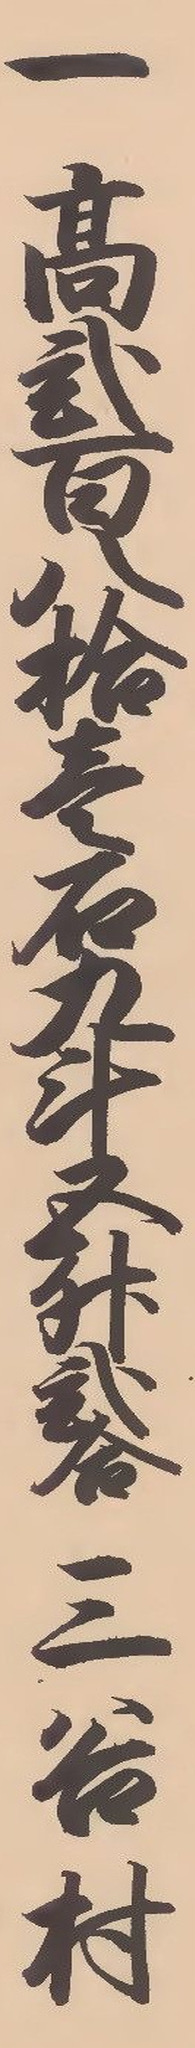一高弐百八拾壱石九斗五升弐合三谷村
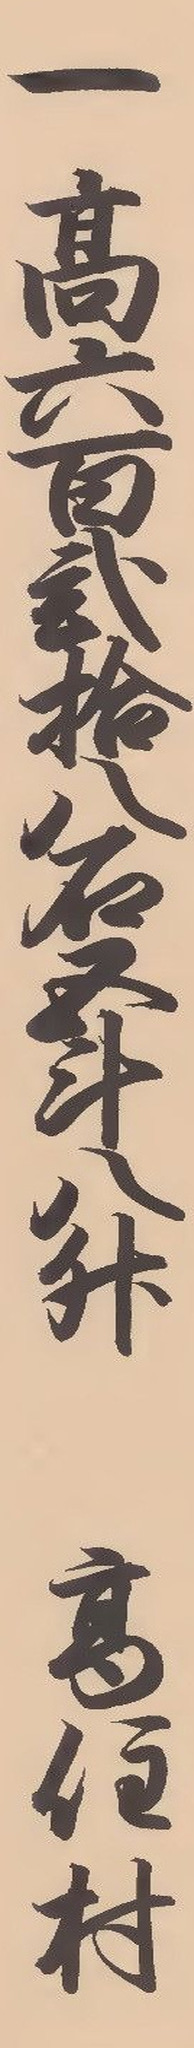一高六百弐拾八石五斗八升高住村
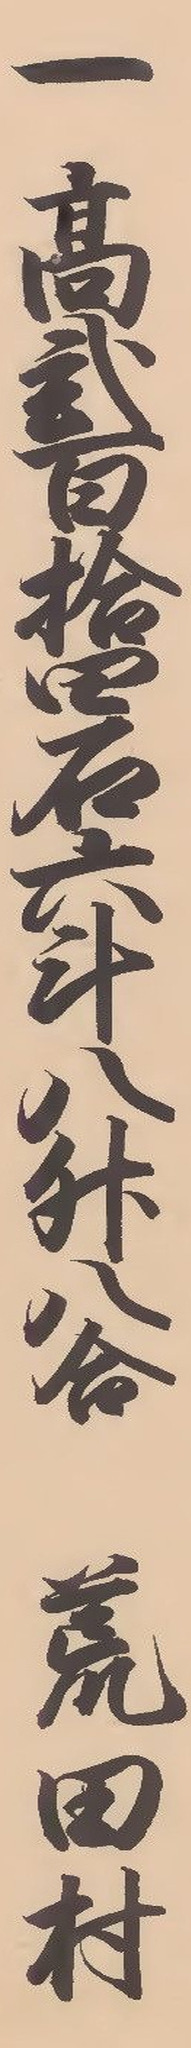一高弐百拾四石六斗八升八合荒田村

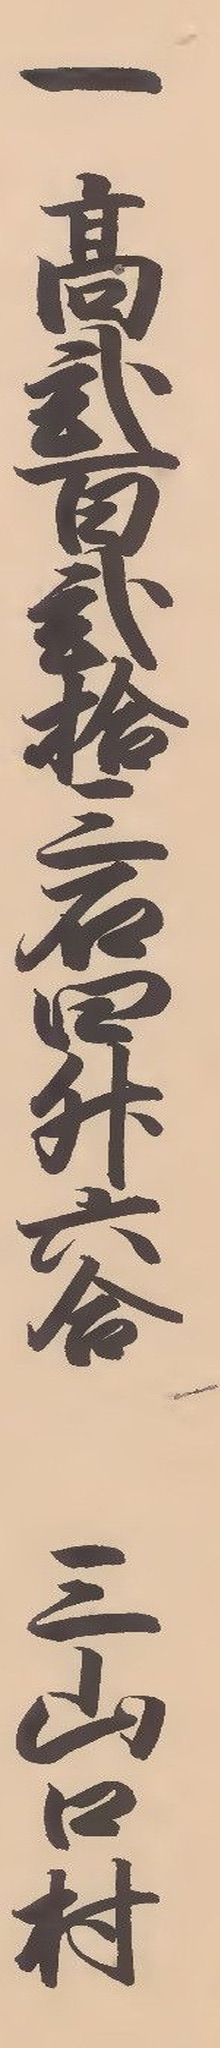一高弐百弐拾三石四升六合三山口村
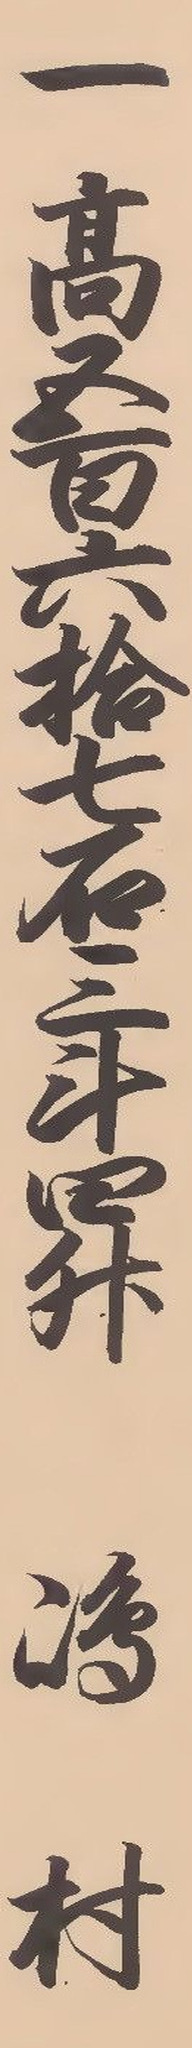一高五百六拾七石三斗四升島村
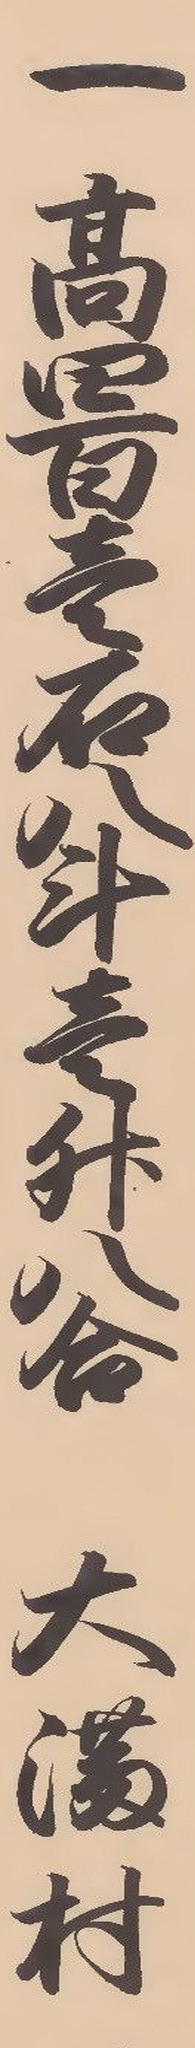一高四百壱石八斗壱升八合大満村
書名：因幡国郷帳
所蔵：国立公文書館 National Archives of Japan
